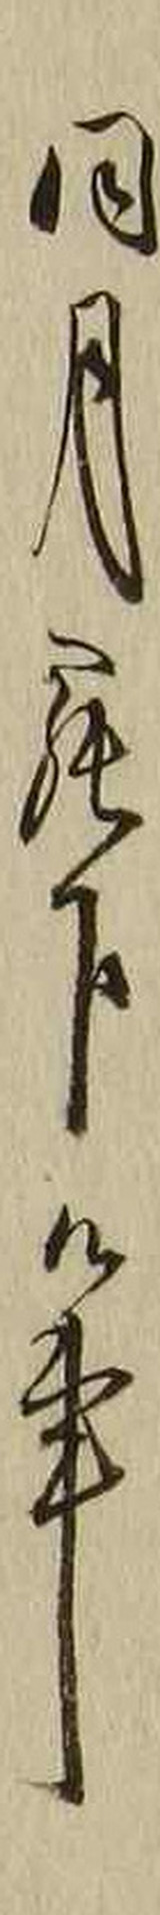同月罷下候事
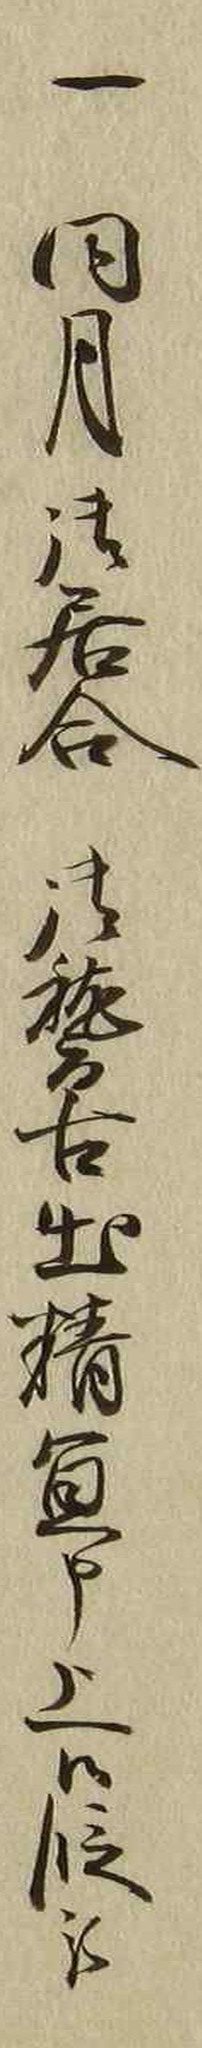一同月御居合御稽古出精宜申上候段被
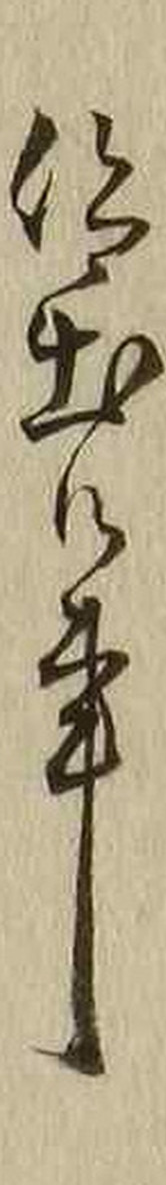仰出候事
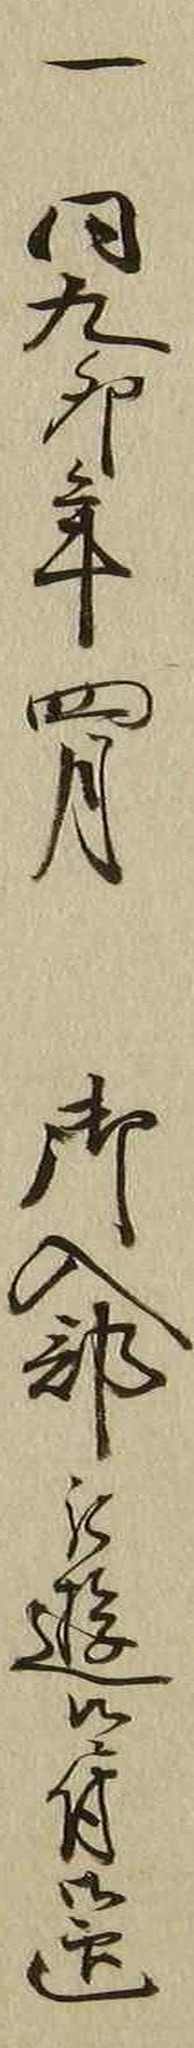一同九卯年四月御入部被遊候に付御迎
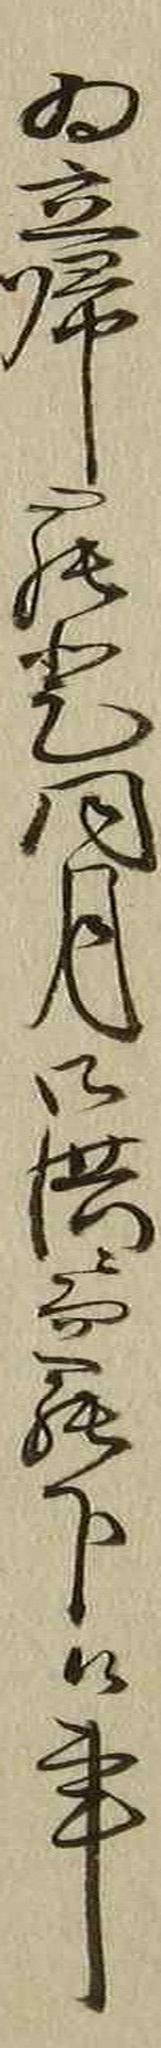為立帰罷登同月御供に而罷下候事
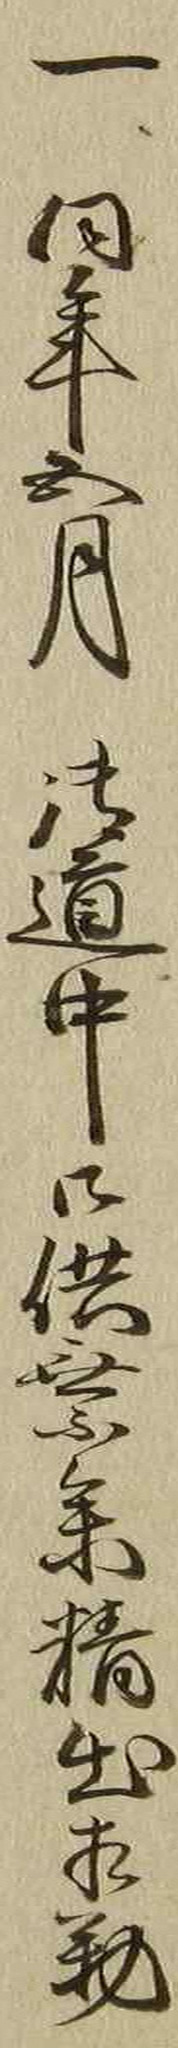一同年五月御道中御供無不参精出相勤
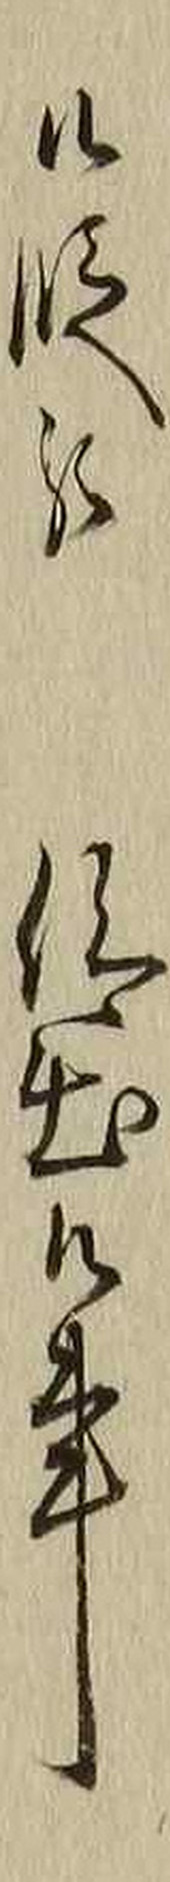候段被仰出候事
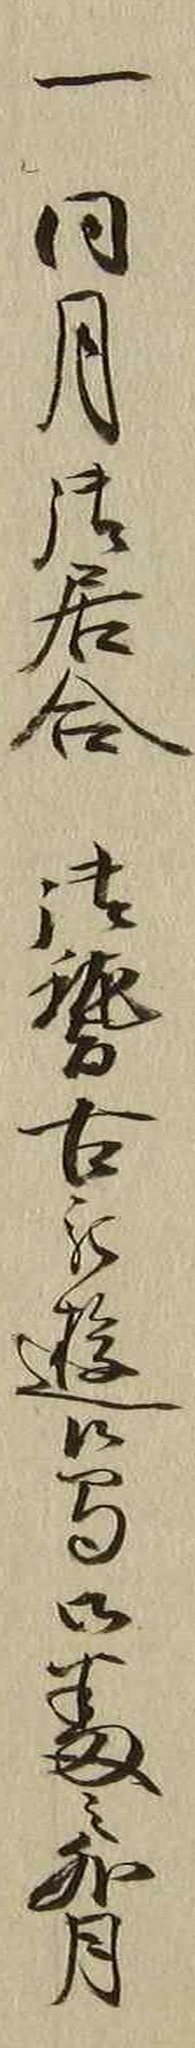一同月御居合御稽古被遊候間御番之外月
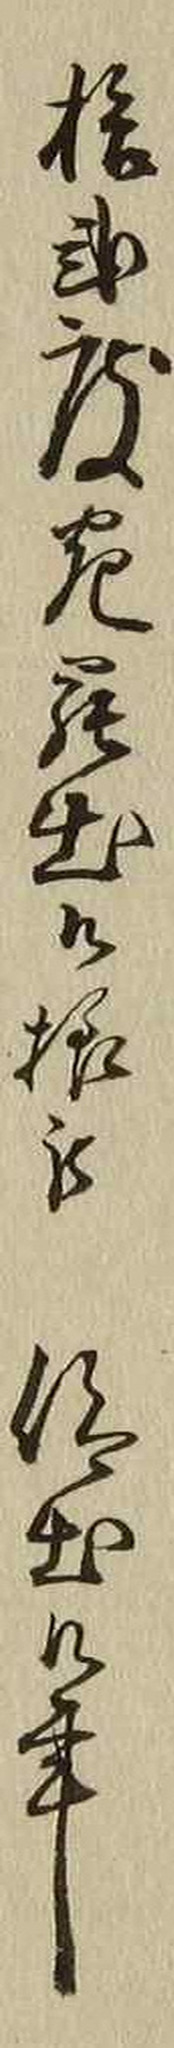拾弐度宛罷出候様被仰出候事
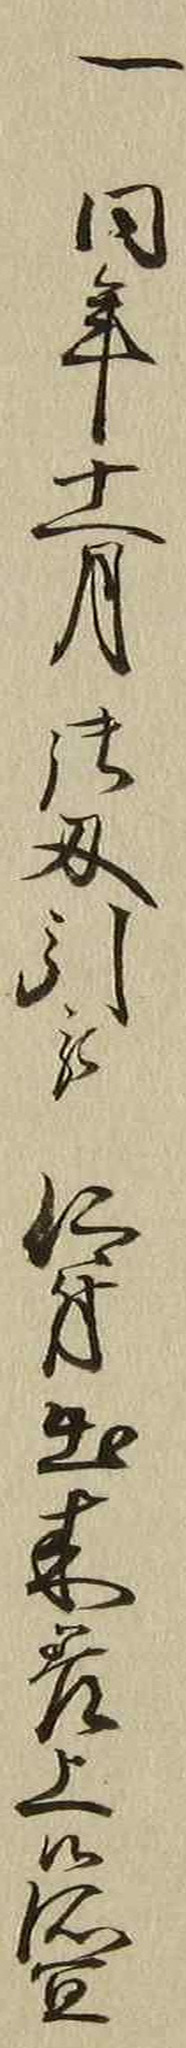一同年十一月御匁引被仰付出来差上侯所宜
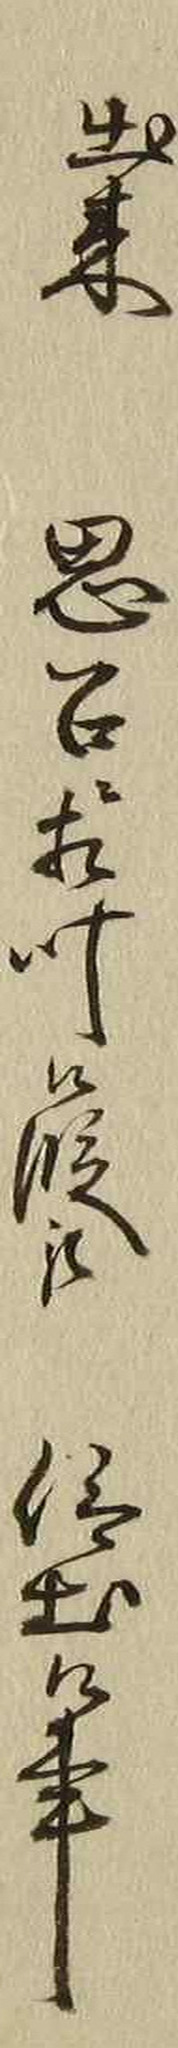出来思召に相叶候段被仰出候事
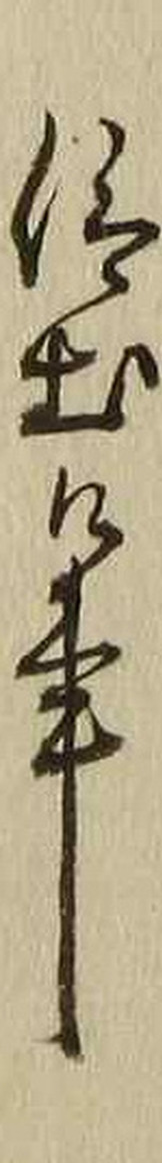仰出候事
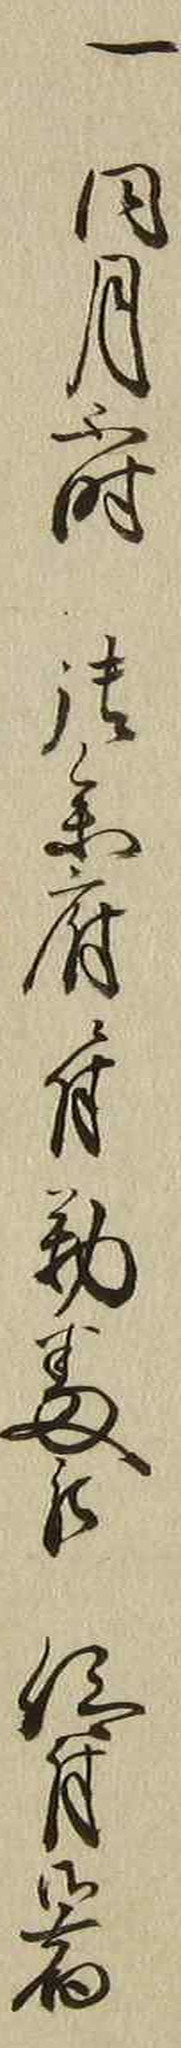一同月不時御参府に付勤番被仰付御宿
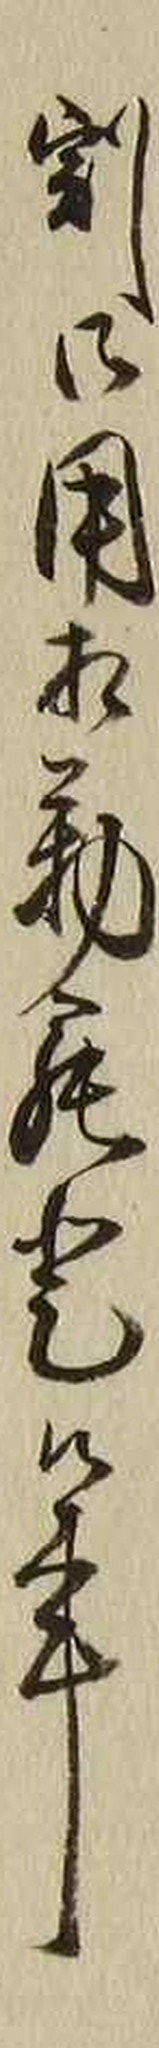割御用相勤罷登候事
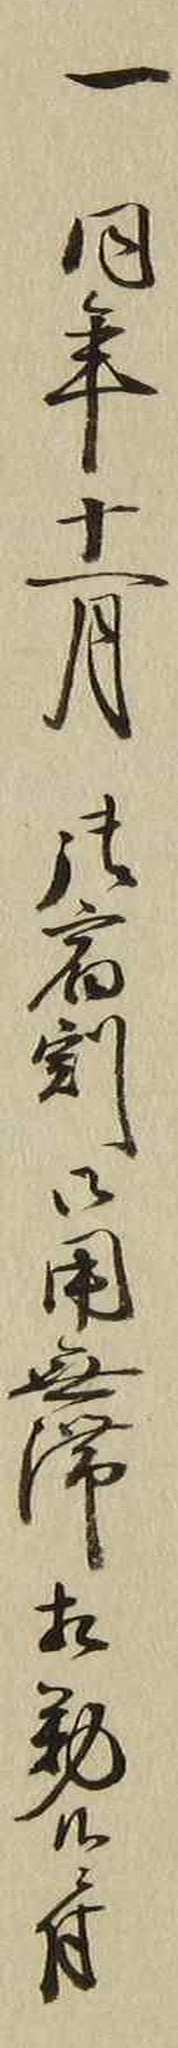一同年十一月御宿割御用無滞相勤候に付
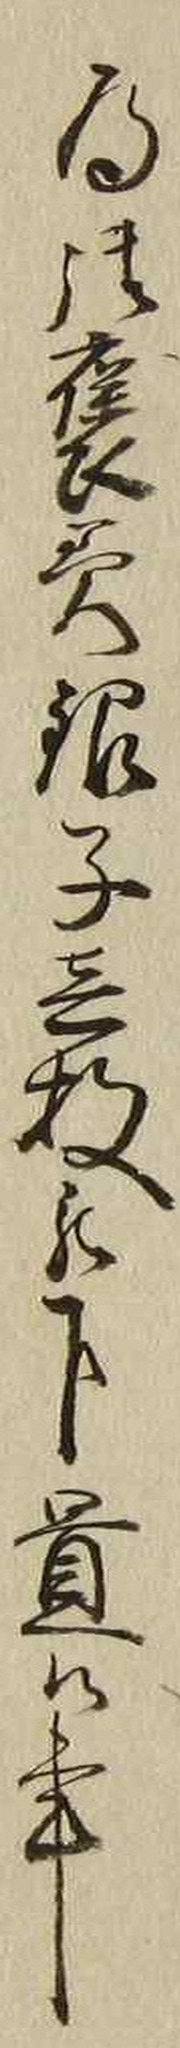為御褒美銀子壱枚被下置候事
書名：諸士系譜　巻之67　を之部1
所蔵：会津若松市立会津図書館
